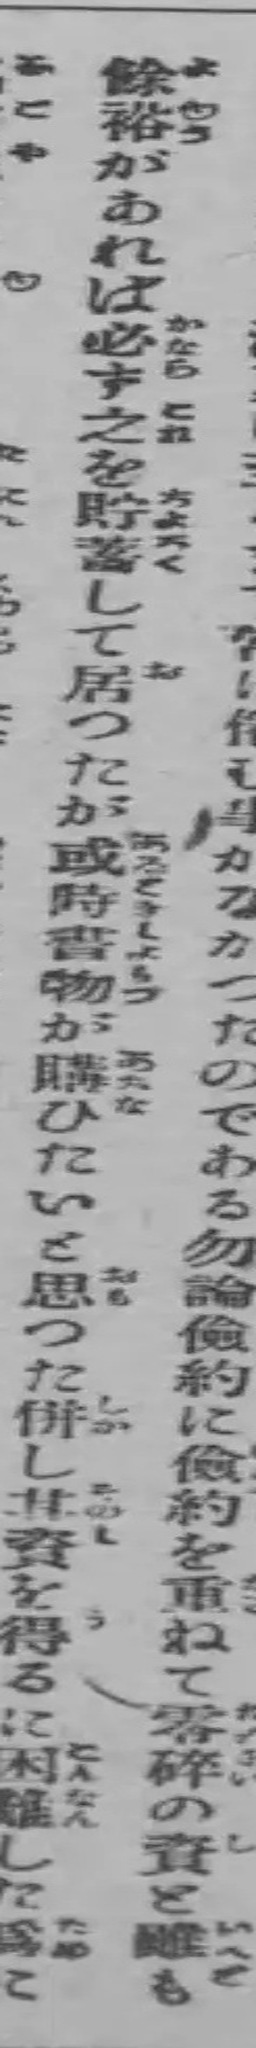余裕があれば必ず之を貯蓄して居つたが或時書物が購ひたいと思つた併し其資を得るに困難した為に
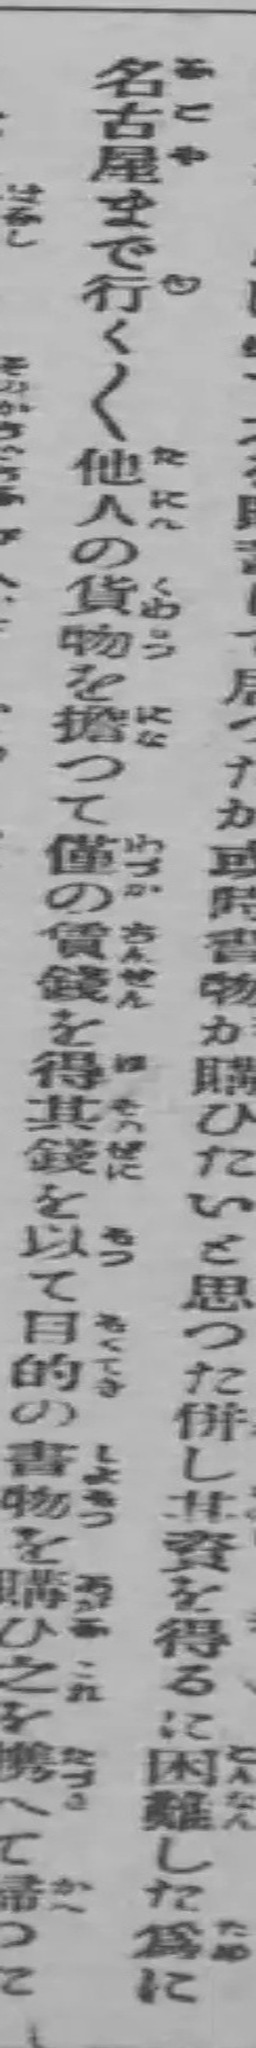名古屋まで行く〳〵他人の貨物を担つて僅の賃銭を得其銭を以て目的の書物を購ひ之を携へて帰つた
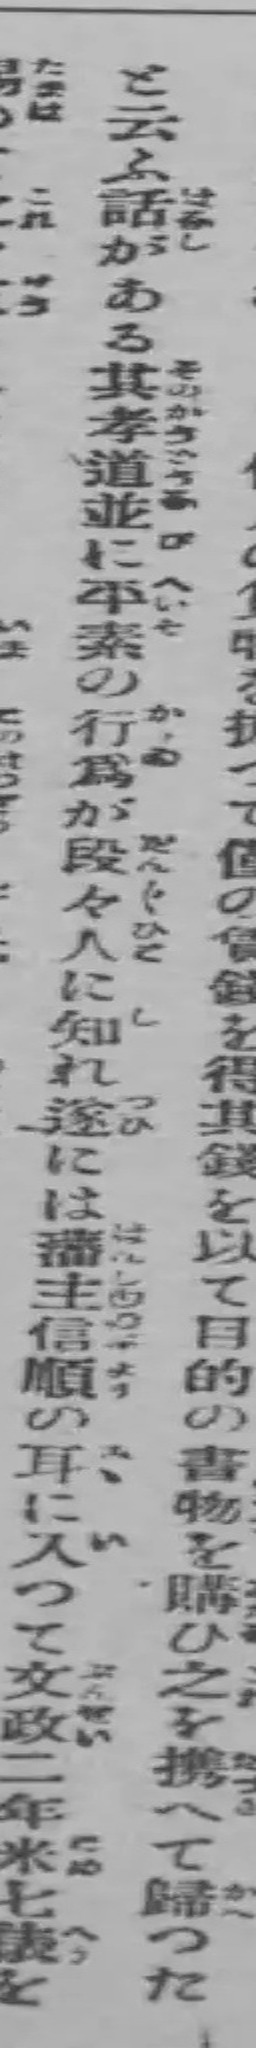と云ふ話がある其孝道並に平素の行為が段々人に知れ遂には藩主信順の耳に入つて文政二年米七俵を
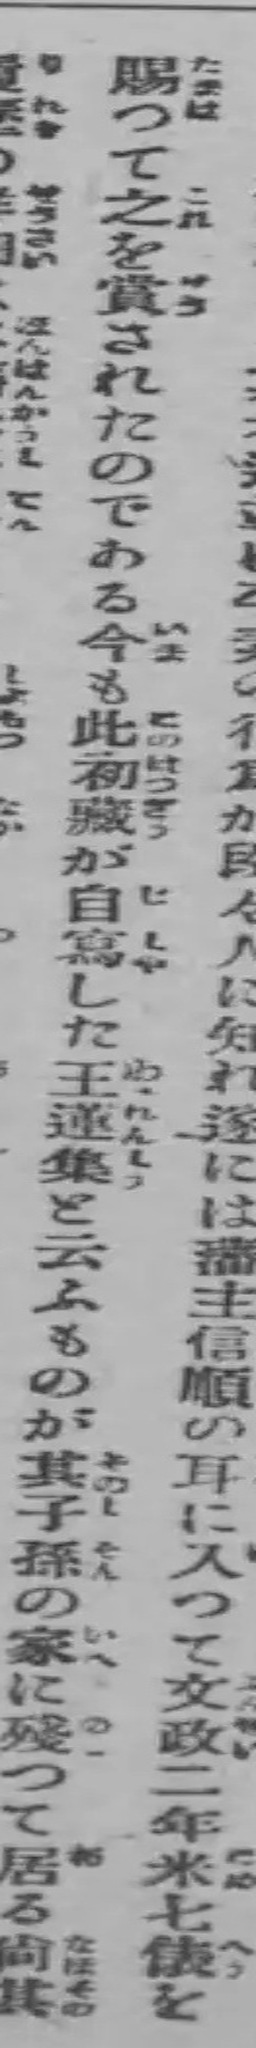賜つて之を賞されたのである今も此初蔵が自写した王蓮集と云ふものが其子孫の家に残つて居る尚其
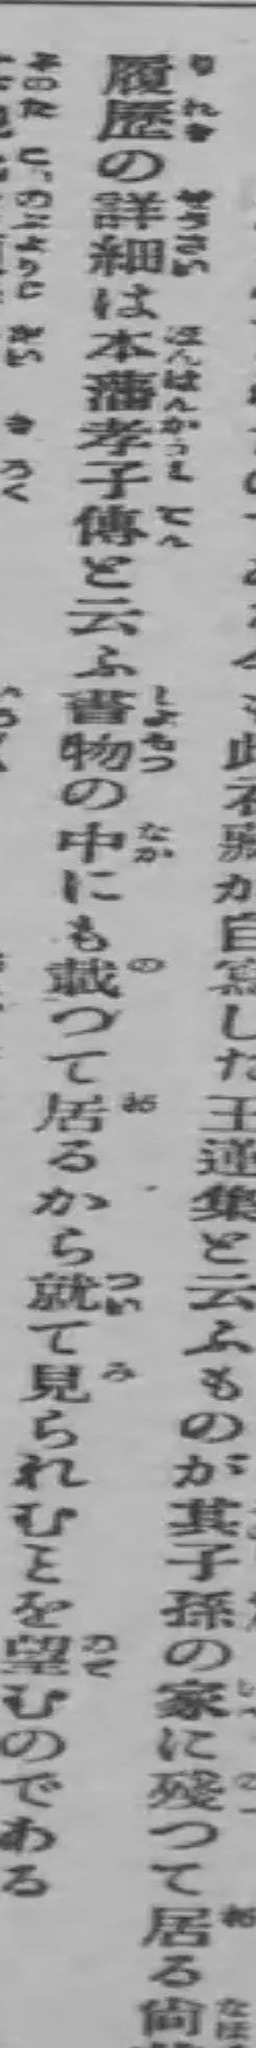履歴の詳細は本藩孝子伝と云ふ書物の中にも載つて居るから就て見られむことを望むのである
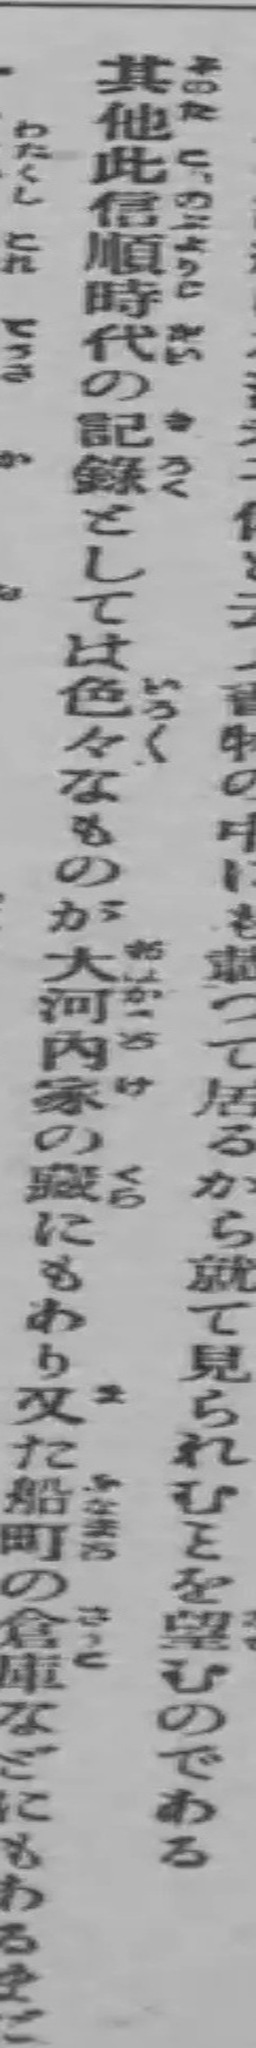其他此信順時代の記録としては色々なものが大河内家の蔵にもあり又た船町の倉庫などにもあるまだ
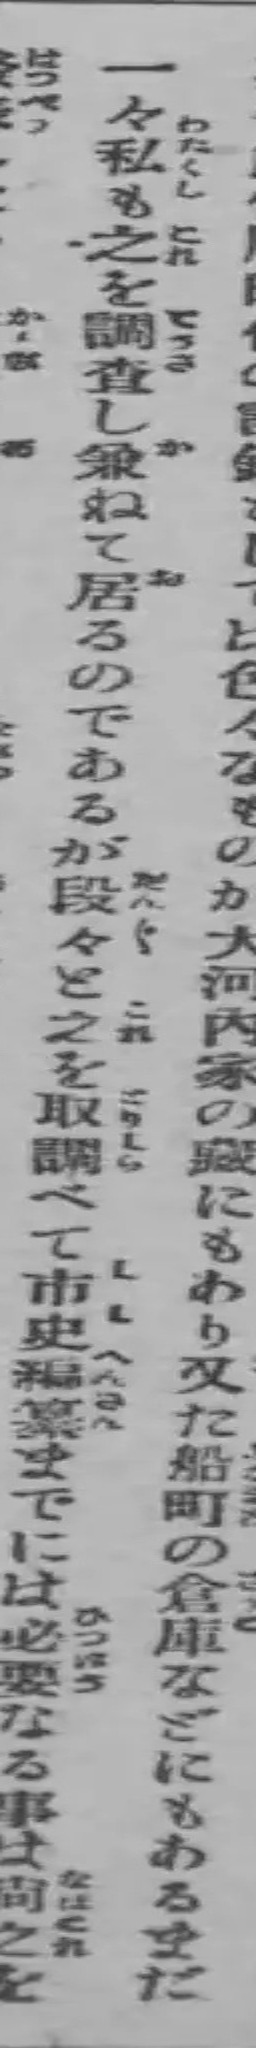一々私も之を調査し兼ねて居るのであるが段々と之を取調べて市史編纂までには必要なる事は尚之を
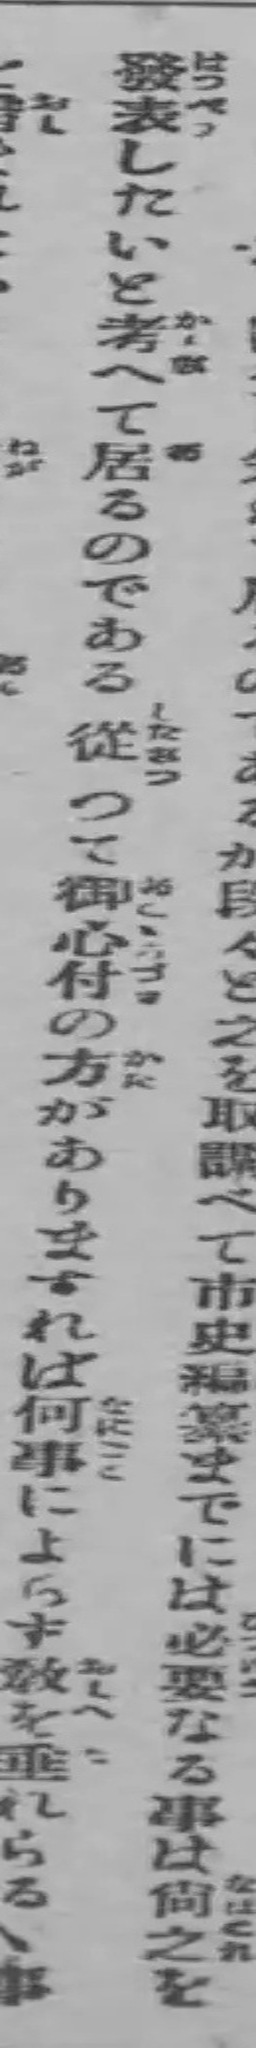発表したいと考へて居るのである従つて御心付の方がありますれば何事によらず教を垂れらるゝ事
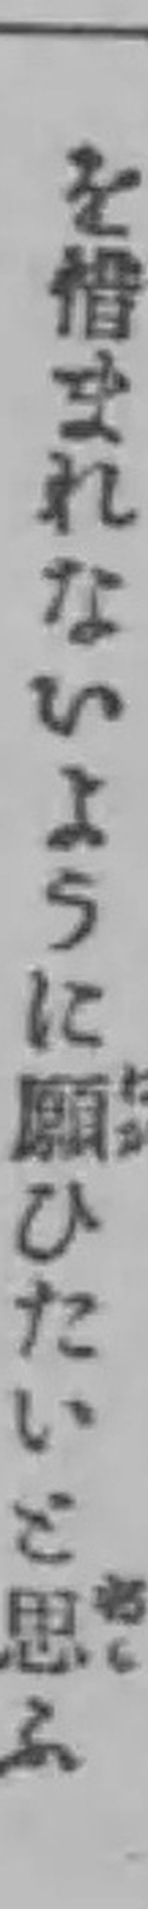を惜まれないように願ひたいと思ふ
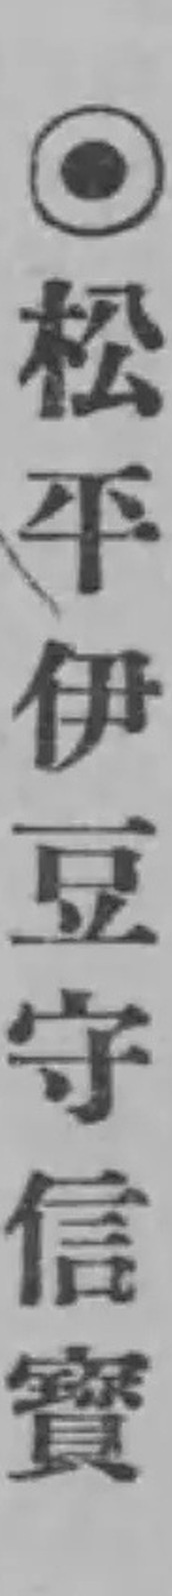⦿松平伊豆守信寶
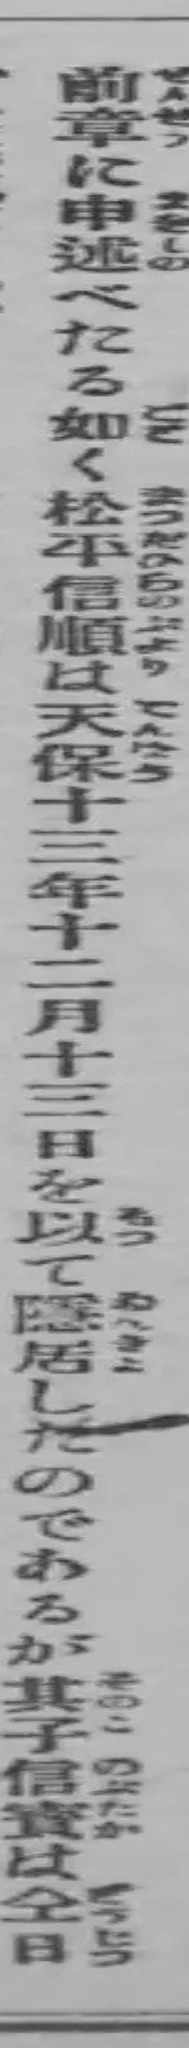松平信寶前章に申述べたる如く松平信順は天保十三年十二月十三日を以て隠居したのであるが其子信寶は仝日
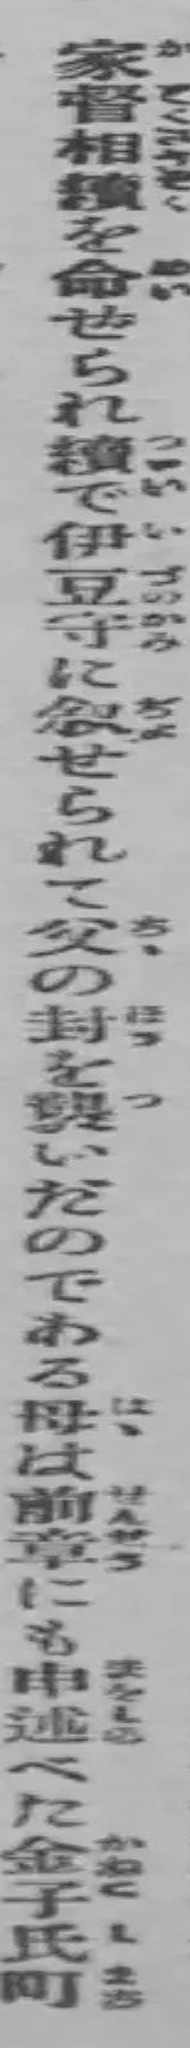家督相続を命ぜられ続て伊豆守に叙せられて父の封を襲いだのである母は前章にも申述べた金子氏町
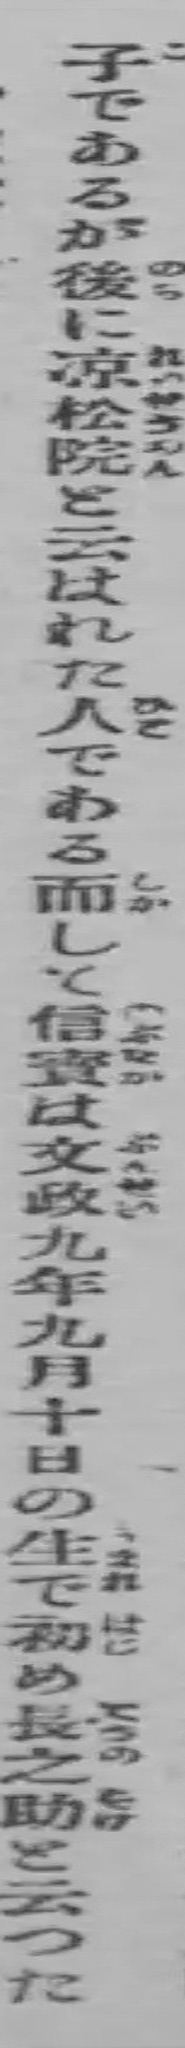子であるが後に冷松院と云はれた人である而して信寶は文政九年九月十日の生で初め長之助と云つた
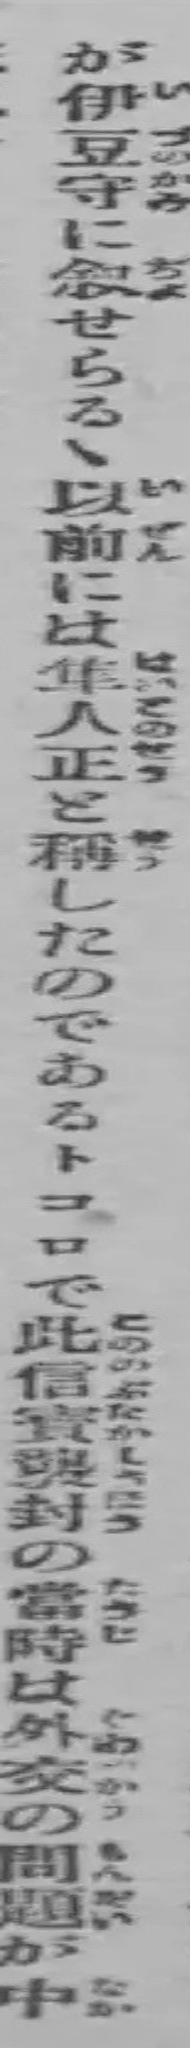が伊豆守に叙せらるゝ以前には隼人正と称したのであるトコロで此信寶襲封の当時は外交の問題が中
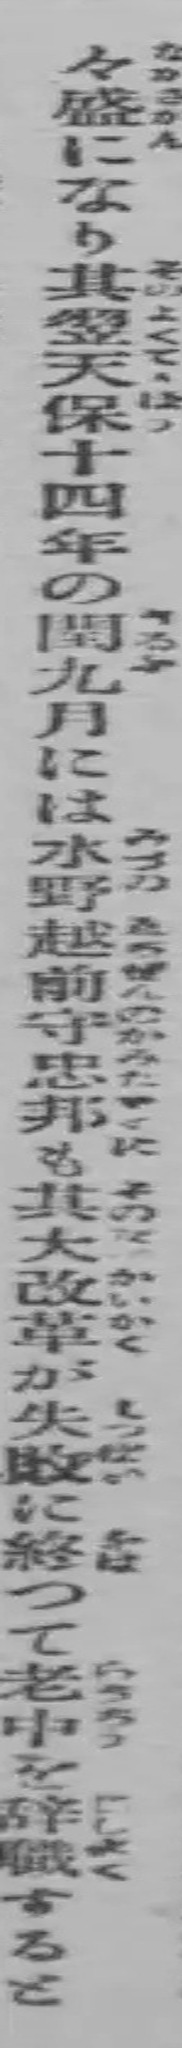中盛になり其翌天保十四年の閏九月には水野越前守忠邦も其大改革が失敗に終つて老中を辞職すると
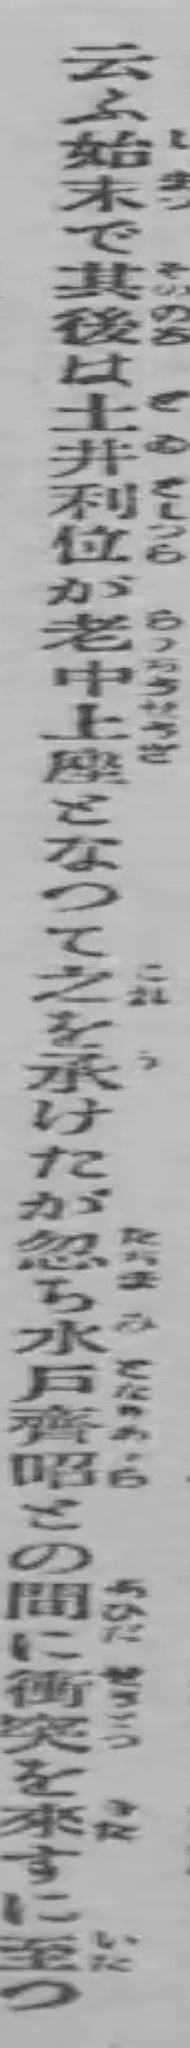云ふ始末で其後は土井利位が老中上座となつて之を承けたが忽ち水戸斉昭との間に衝突を来すに至つ
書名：豊橋市史談
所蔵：国立国会図書館 National Diet Library, JAPAN
